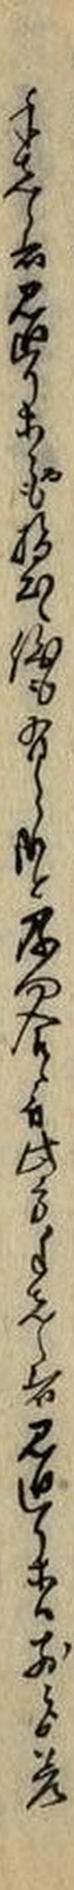手先之者見廻り等にも指出候儀も有之哉と及問合候に付此方手先之者見廻り等は前々ゟ差
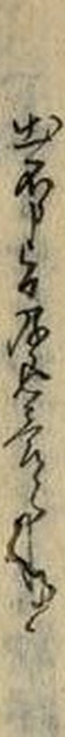出不申旨及返答事候
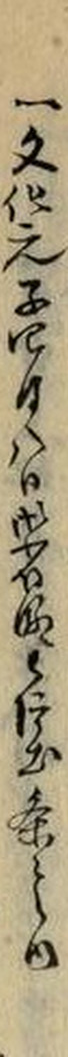一文化元子四月八日御省略被仰出条々之内
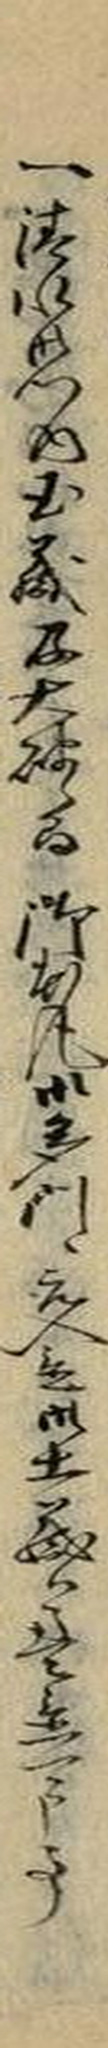一清水御門内玉蔵及大破候間御本丸御多門へ取入置御土蔵は畳置可申事
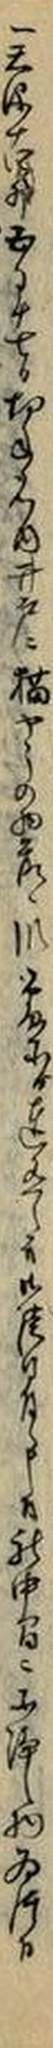一天保十四卯五月十七日切手御門内井戸に猫やうの物落候段御番所ゟ達有之付御徒目付へ申付新中間に不浄之物為片付
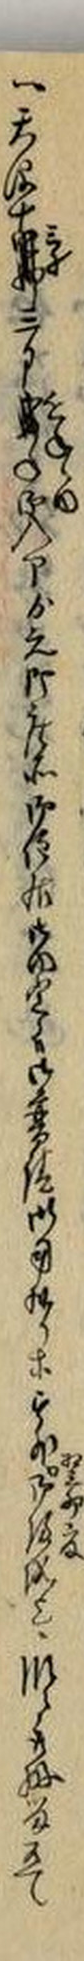一天保十三刁三月近年之内年御入部ゟ元御座所御住居御内定に付御普請御用掛り等其外◦翌卯夏御帰城迄に段々取扱留有之
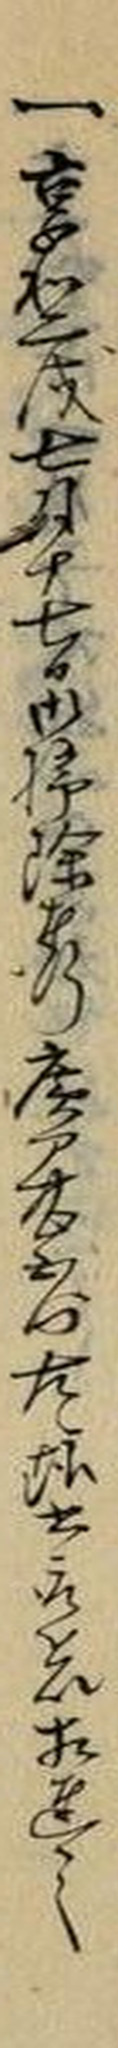一享和二戌七月十七日御掃除奉行広部甚五右衛門左之趣書取を以相達之
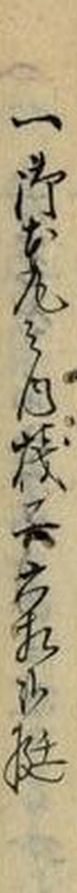一御本丸之内桟子六拾弐挺
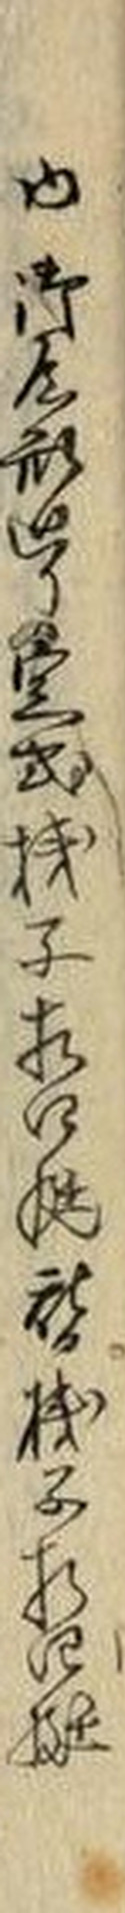内御屋形廻り定式桟子拾四挺替桟子拾四挺
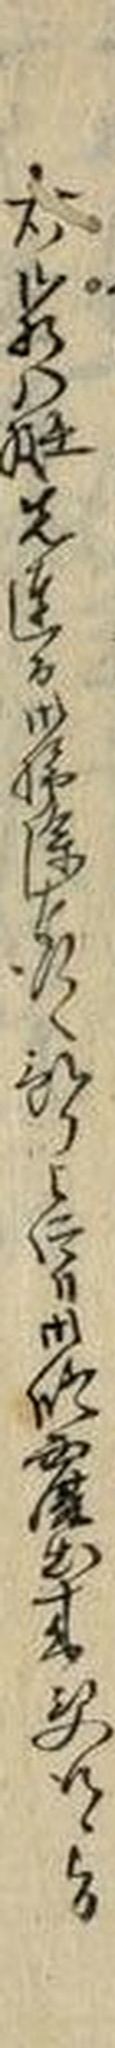右弐拾八挺先達而御掃除奉行へ預り被仰付御修覆出来受取候旨
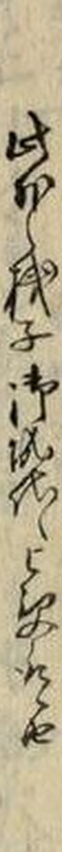此外之桟子御城代へ被受取候由
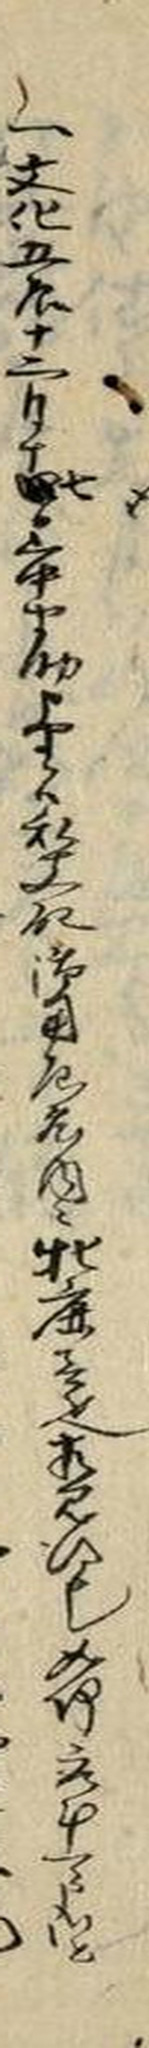一文化五辰十二月十七日山中半助申聞候は私支配御用屋敷内に牡鹿壱疋相見得申候如何取斗可申哉と
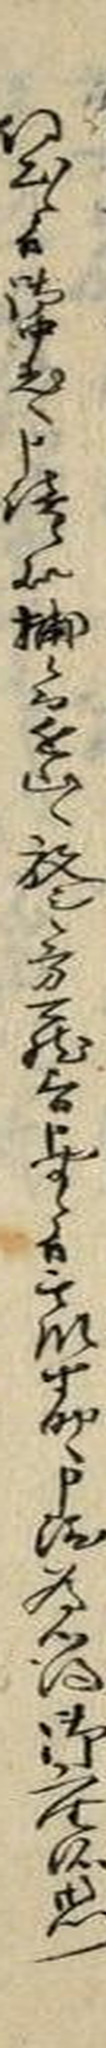伺出候に付御中老へ申談候処捕候て近山へ放し候方可然旨申聞候に付其段半助へ申渡為心得御座所御門
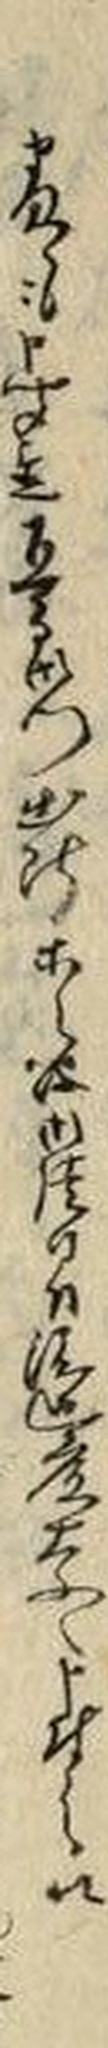番へも申聞置下馬御門出断等之儀御徒目付渡辺彦太夫へ申付之候
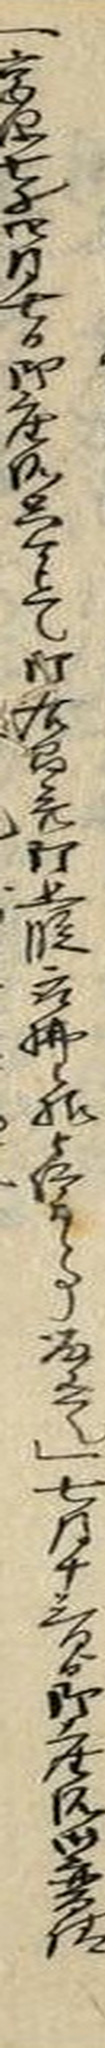一享保七刁四月七日御座所只今之御居間并御上段取払候様被仰付候事留有之」七月十三日ゟ御座所御普請
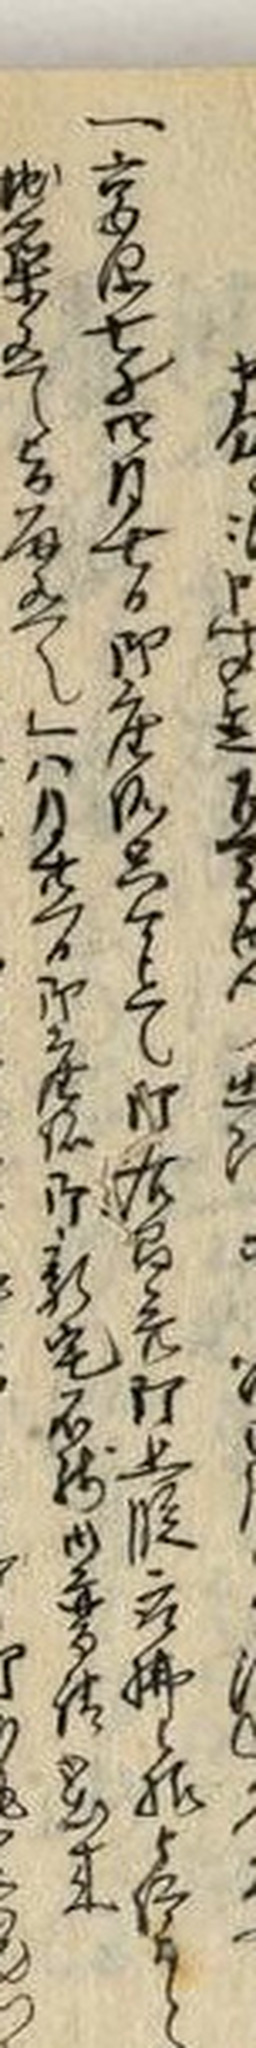地築有之旨留有之」八月廿一日御座所御新宅不残御普請御出来
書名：御城下諸事之部
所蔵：福井県文書館 Fukui Prefectural Archives
